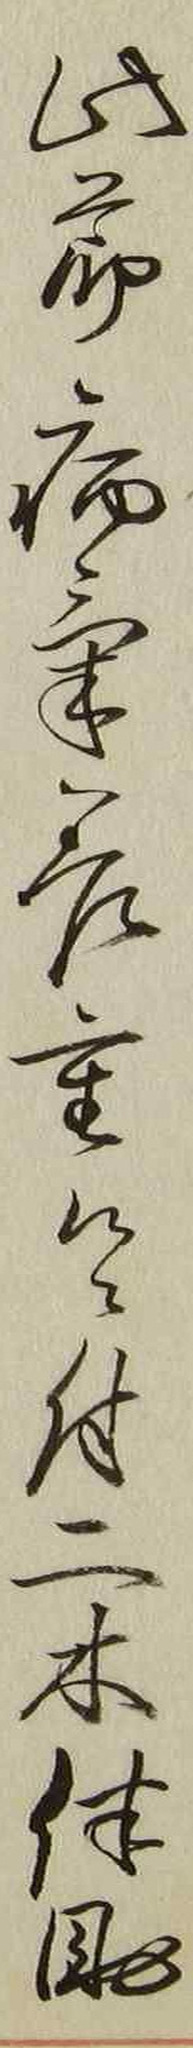此節病気差重候ニ付二木伴助
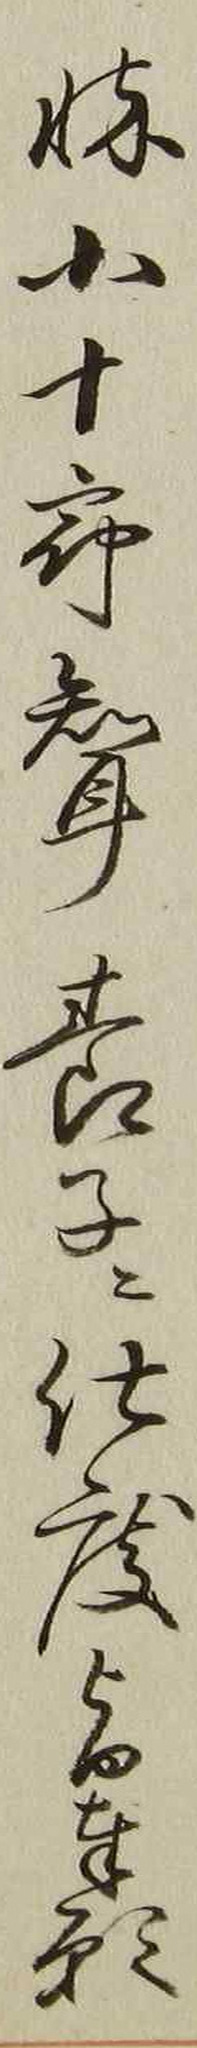忰小十郎聟養子ニ仕度旨奉願
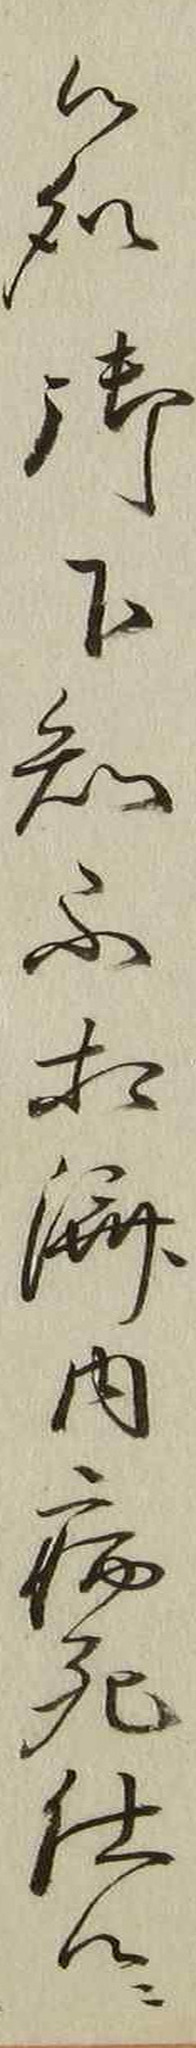候処御下知不相済内病死仕候ニ
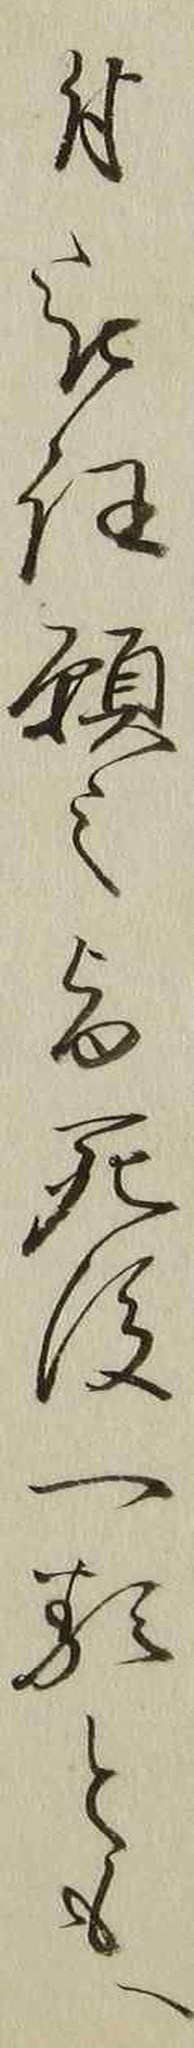付被任願之旨死後一類ともへ
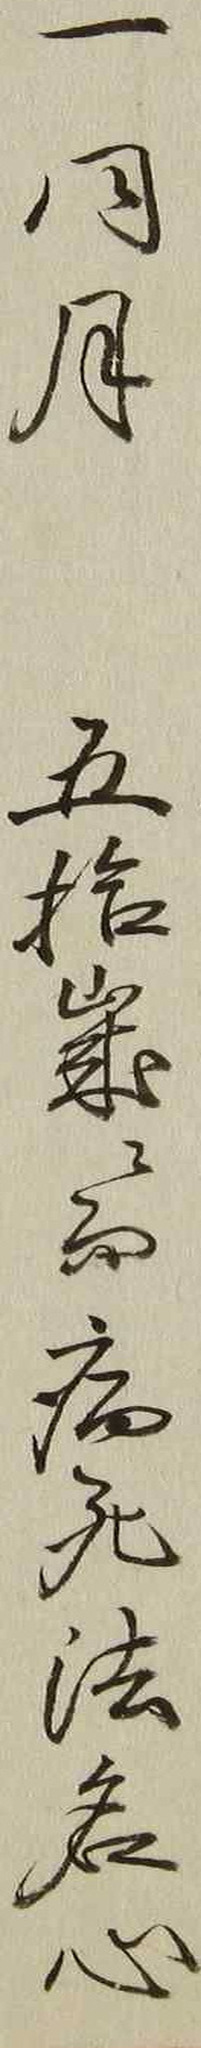一同月五拾歳ニ而病死法名心
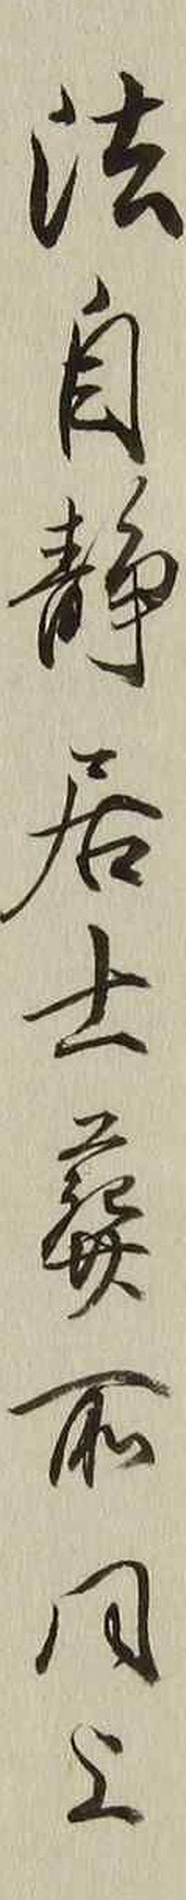法自静居士葬所同上
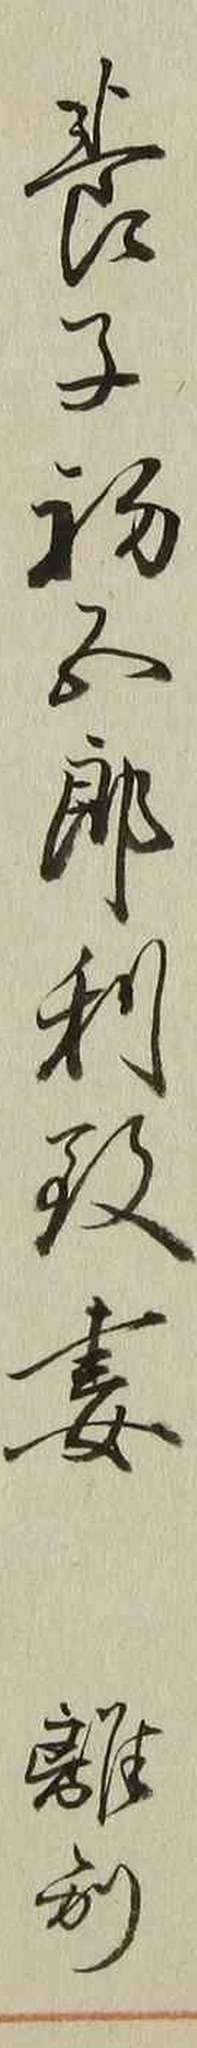養子初五郎利政妻離別
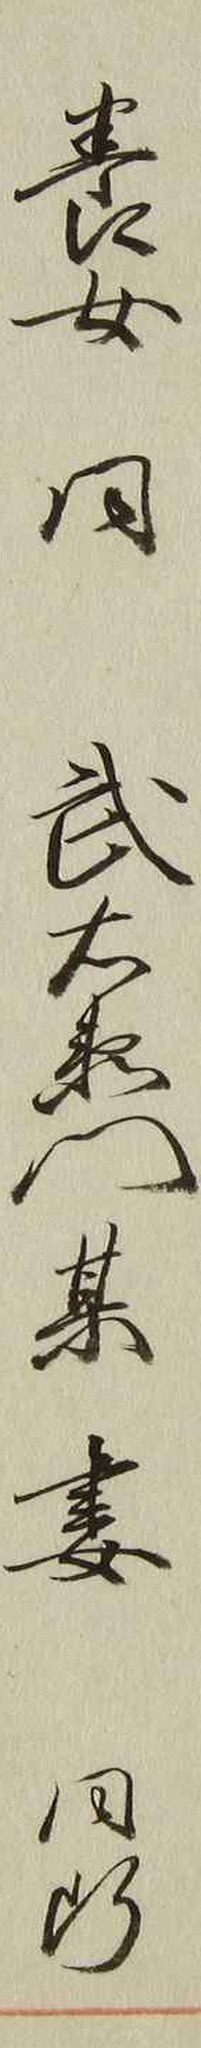養女同武右衛門何某妻同断
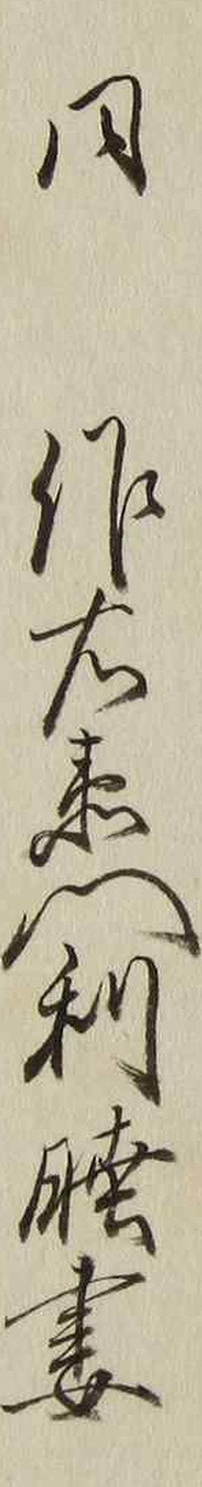同作右衛門利睦妻
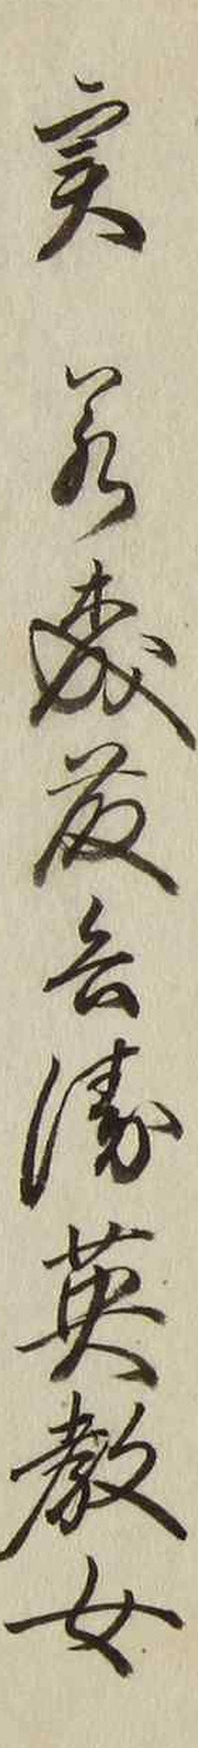実若森藤兵衛英教女

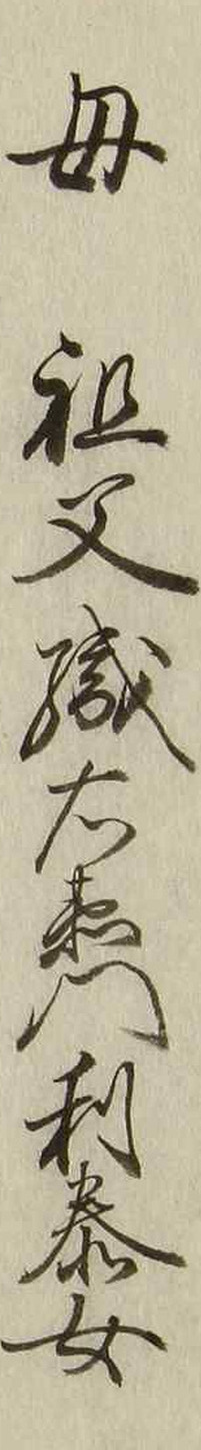母祖父職右衛門利泰女
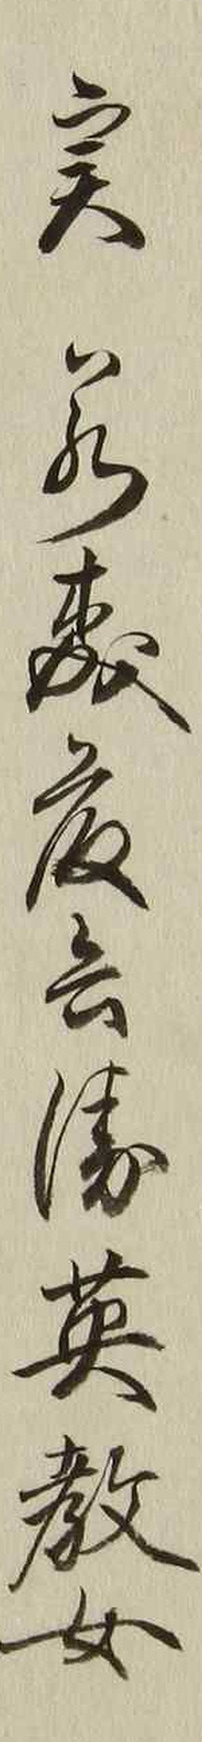実若森藤兵衛英教女
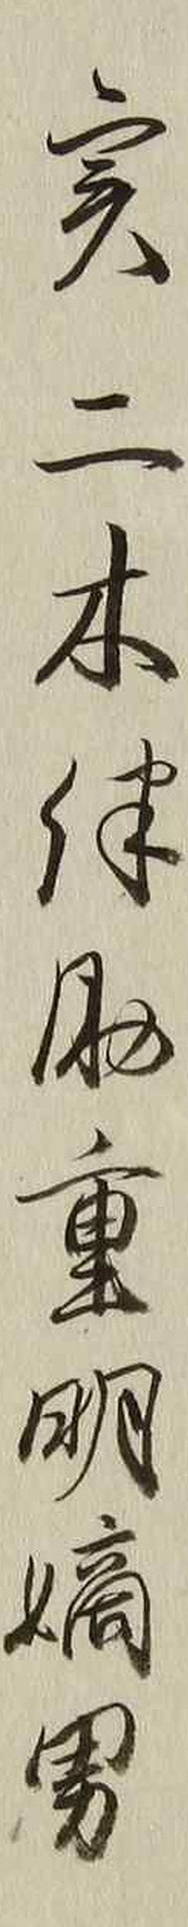実ニ木伴助重明嫡男
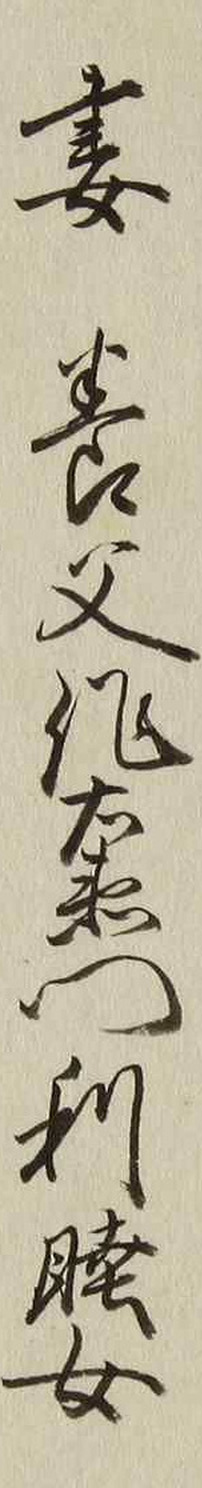妻養父作右衛門利睦女
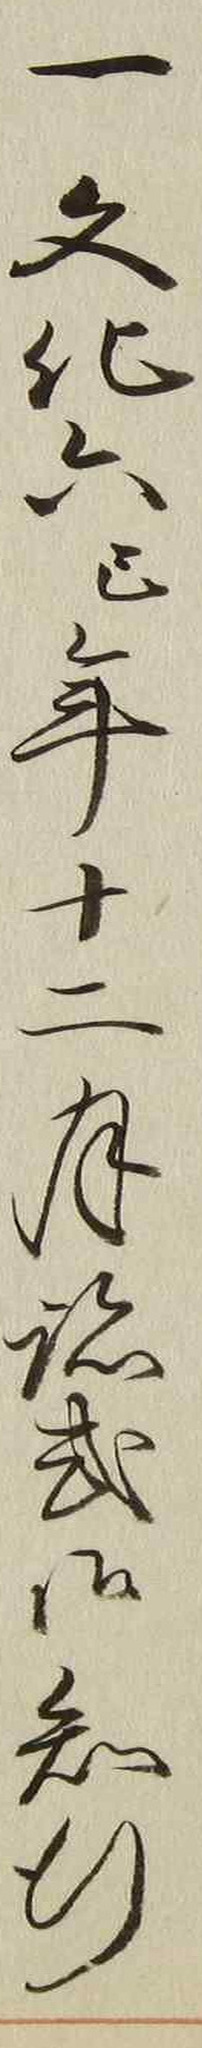一文化六巳年十二月跡式御知行
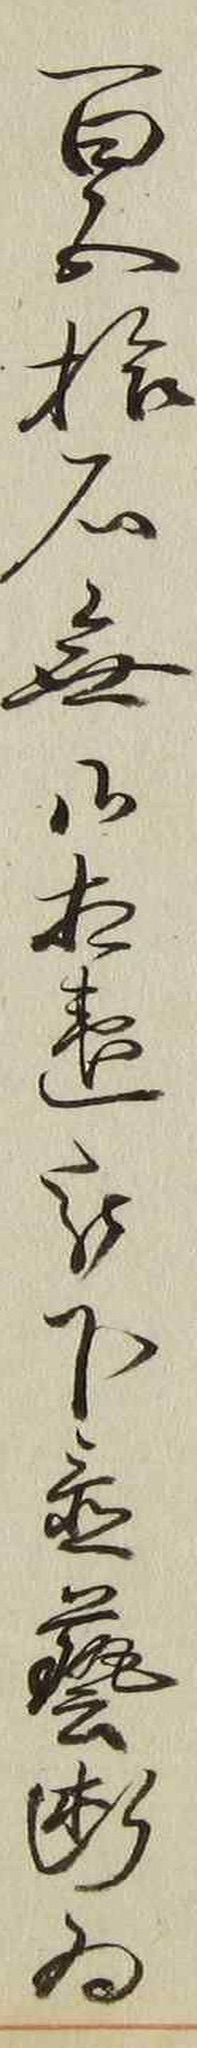百五拾石無御相違被下置芸術為
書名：諸士系譜　巻之54　ほ之部1
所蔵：会津若松市立会津図書館
